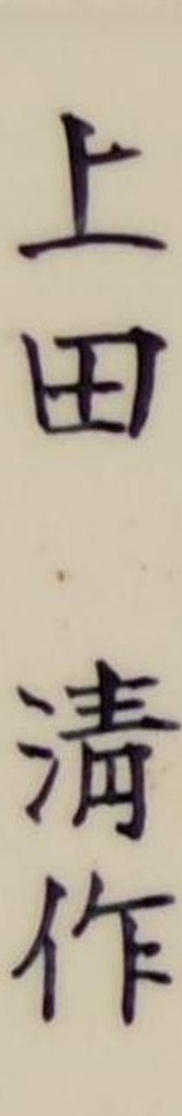上田清作

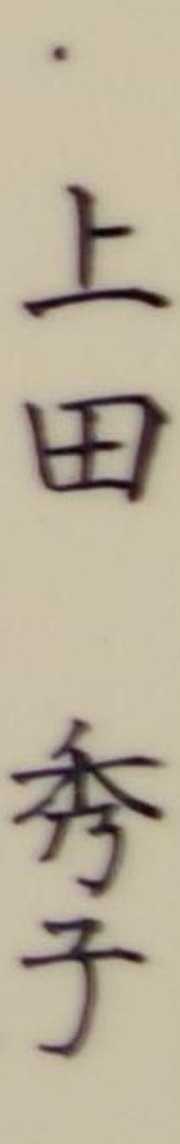上田秀子
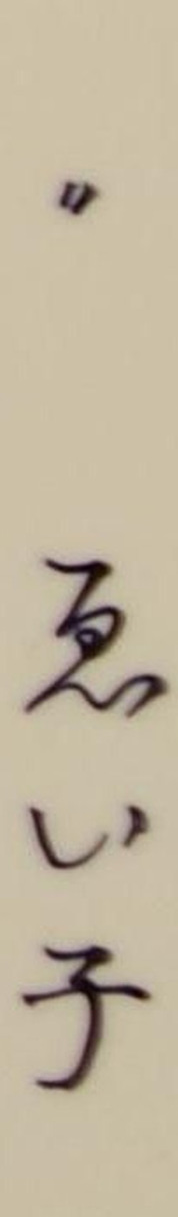ゑい子
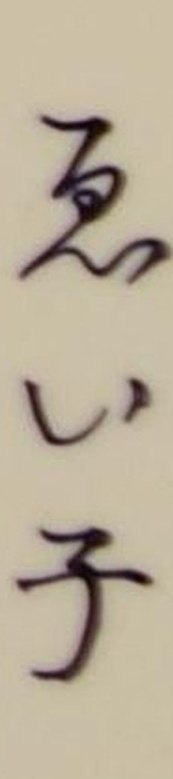ゑい子
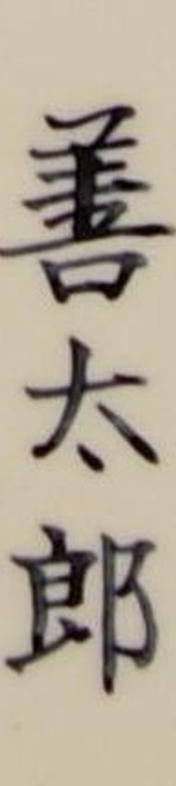善太郎
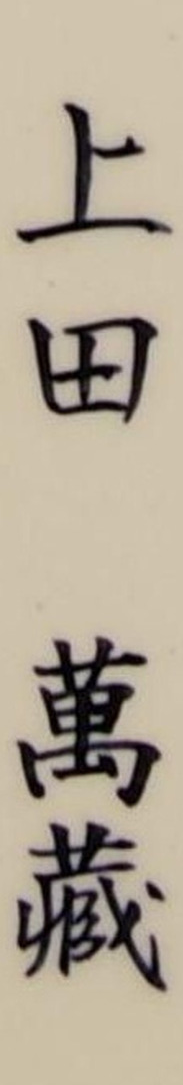上田萬蔵
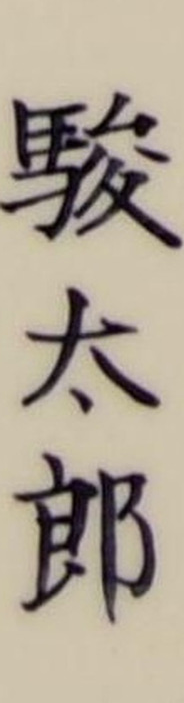駿太郎
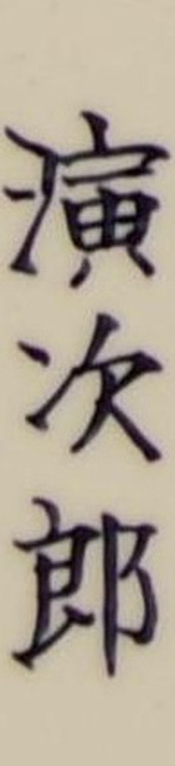演次郎
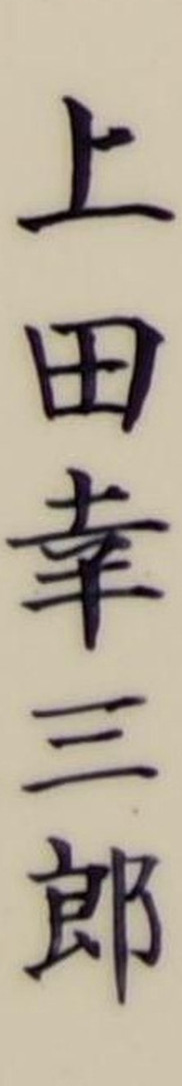上田幸三郎
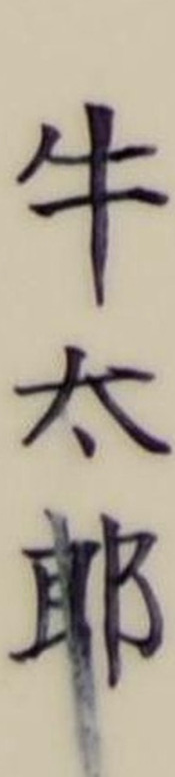牛太郎
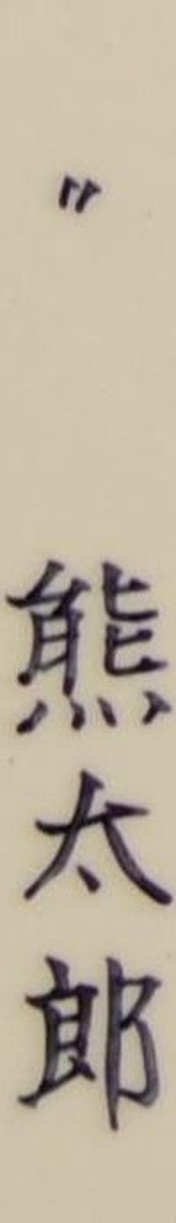熊太郎
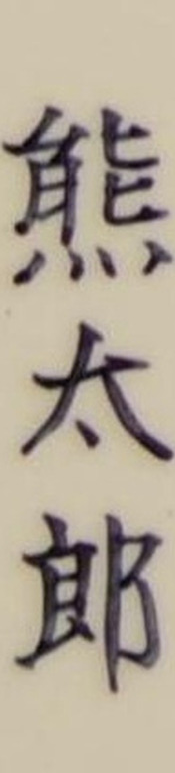熊太郎
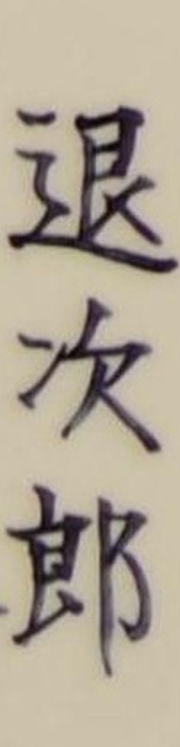退次郎

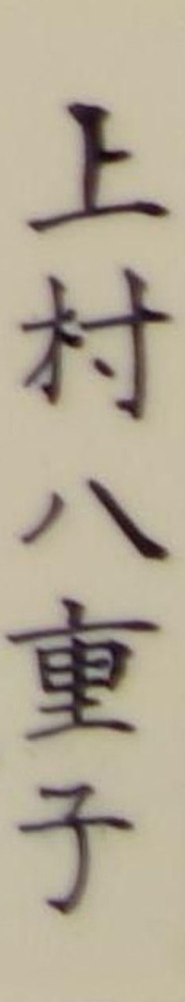上村八重子
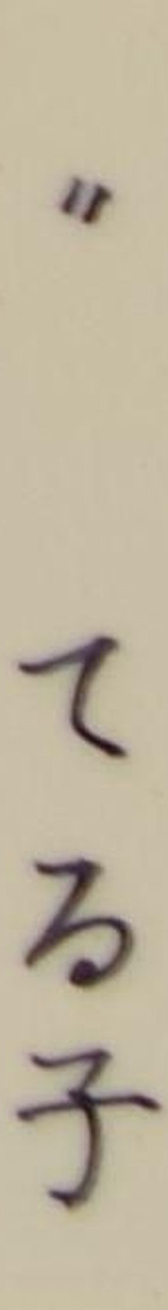てる子
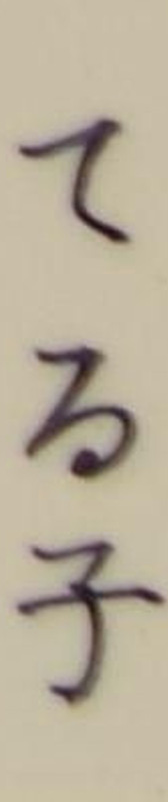てる子
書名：A~D
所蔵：koyasan kongobuji
